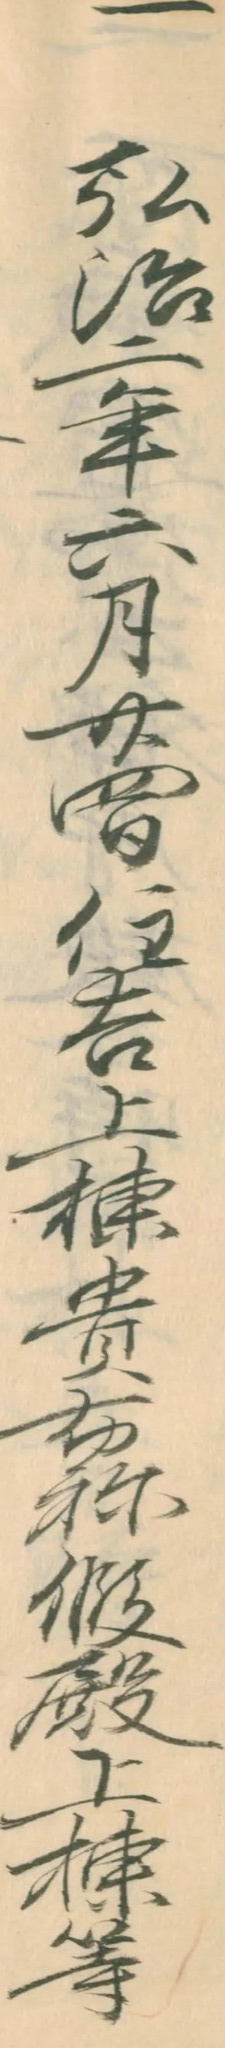一弘治二年六月廿四日住吉上棟貴布祢仮殿上棟等
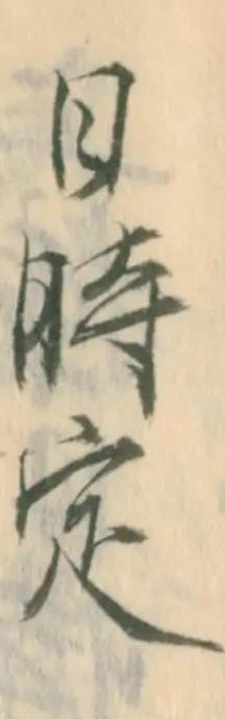日時定
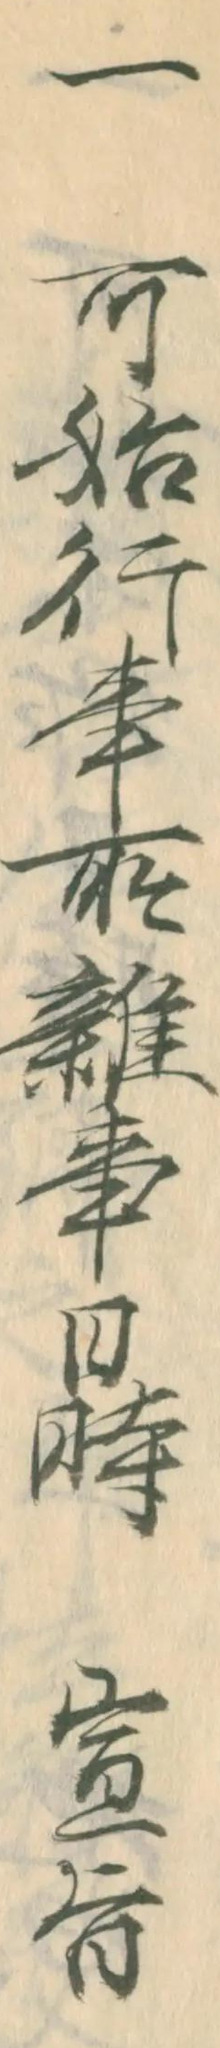一可始行事所雑事日時宣旨
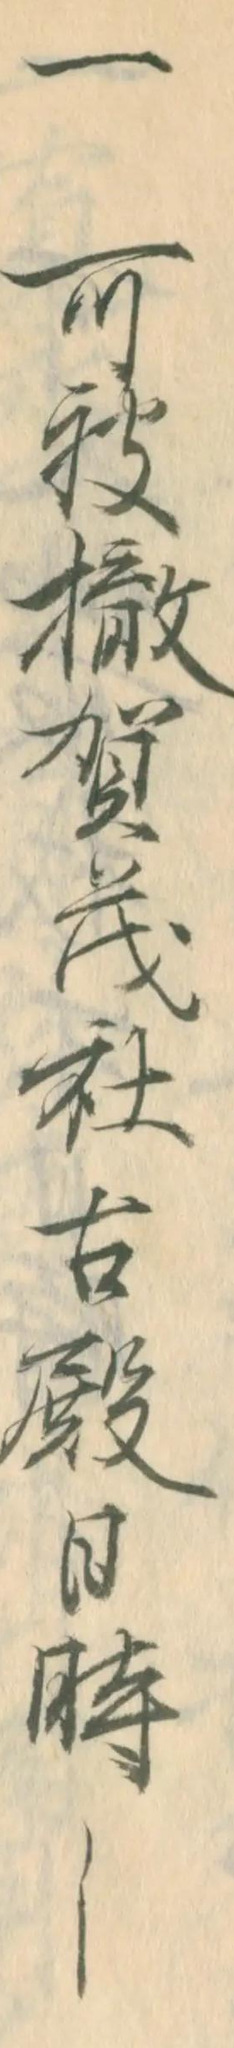一可被撒賀茂社古殿日時ーー
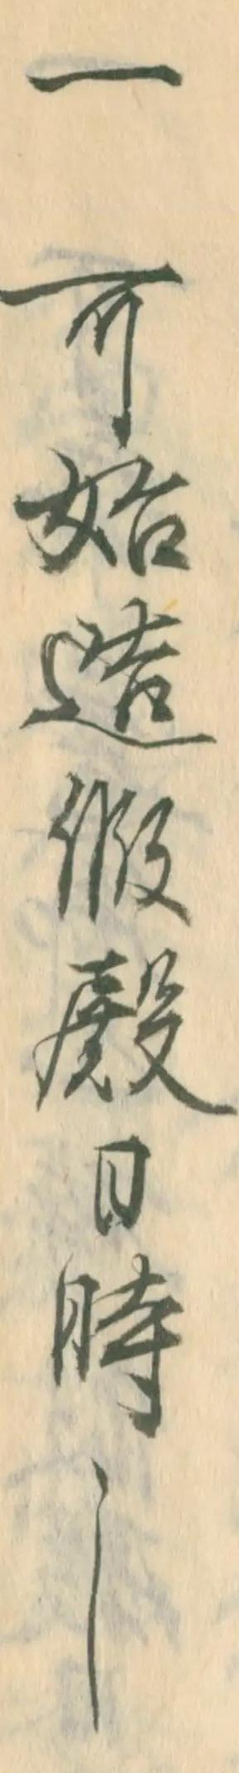一可始造仮殿日時ーー

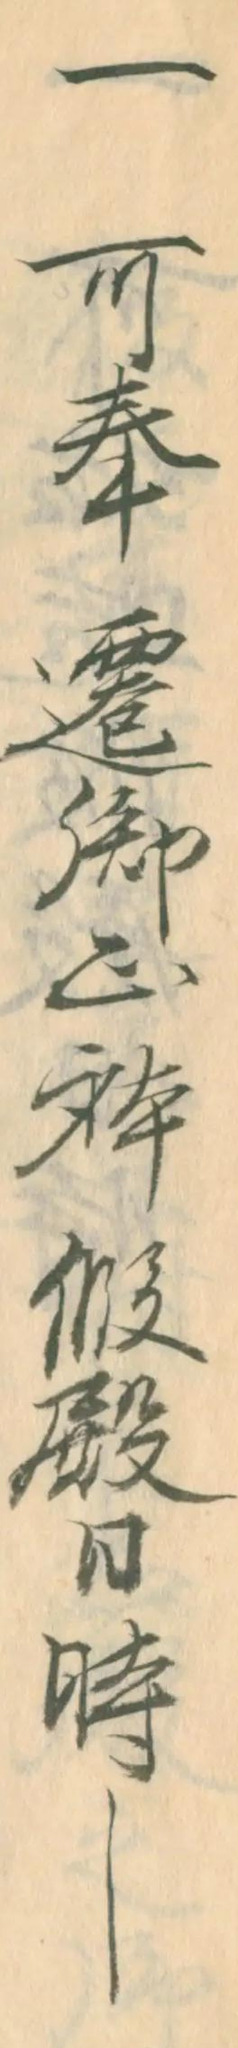一可奉遷御正体仮殿日時ーー
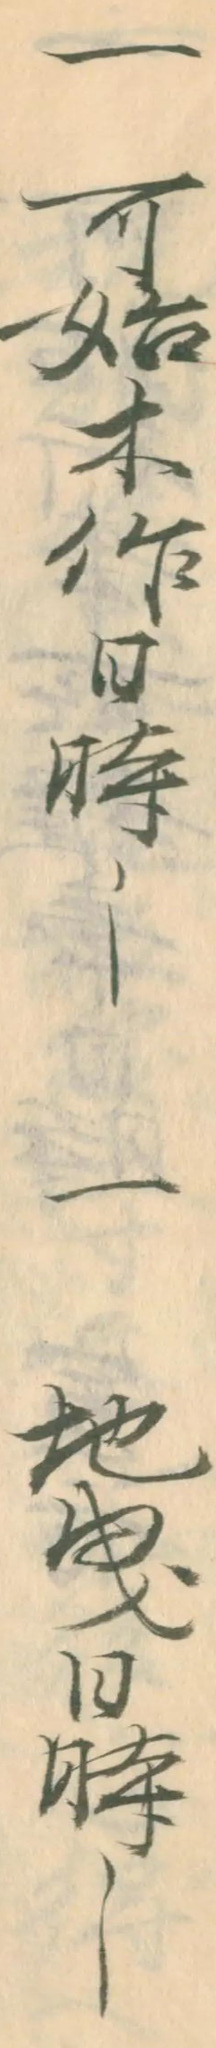一可始木作日時ーー一地曳日時ーー
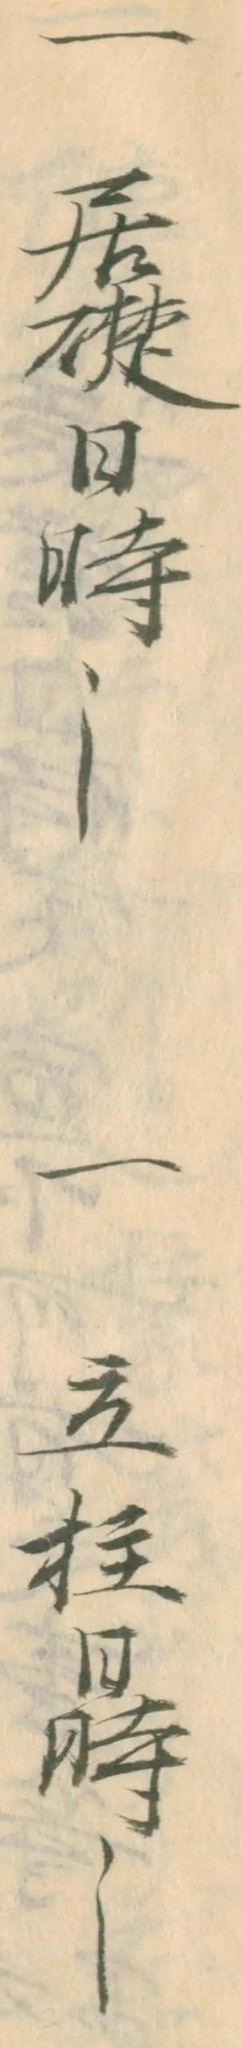一居礎日時ーー一立柱日時ーー
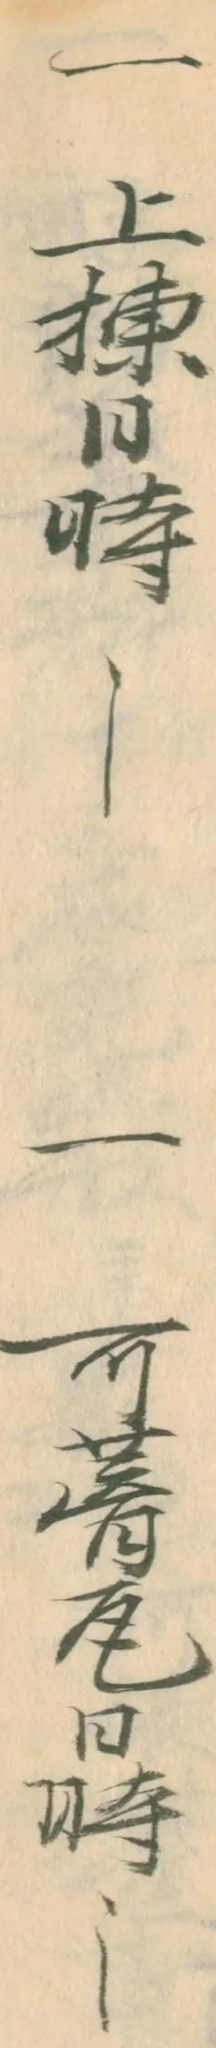一上棟日時ーー一可葺瓦日時ーー
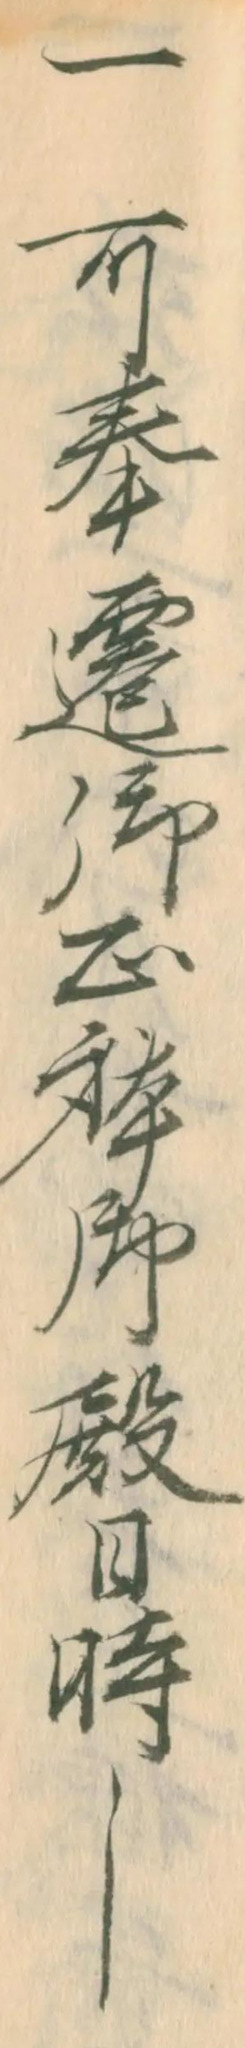一可奉遷御正体御殿日時ーー
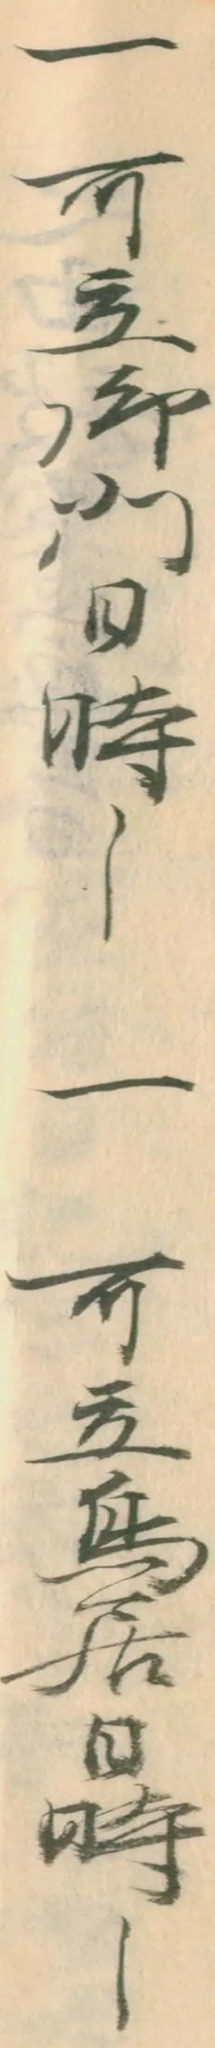一可立御門日時ーー一可立鳥居日時ーー
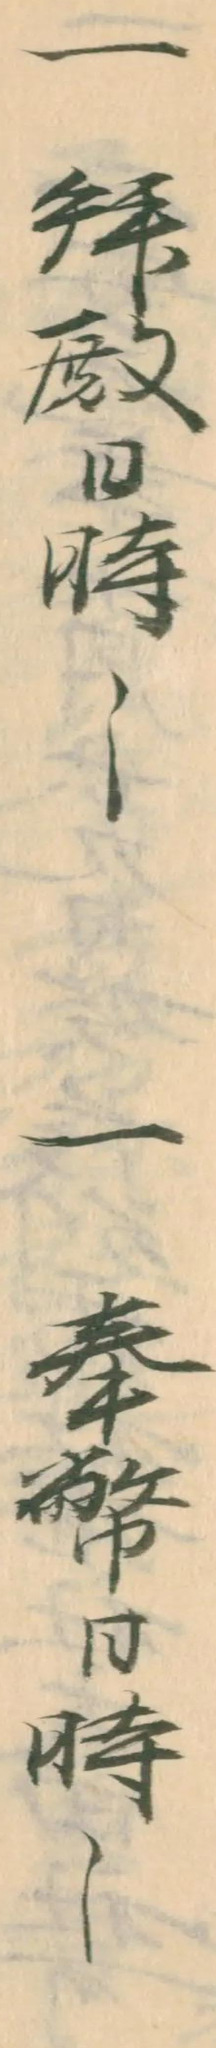一拝殿日時ーー一奉幣日時ーー
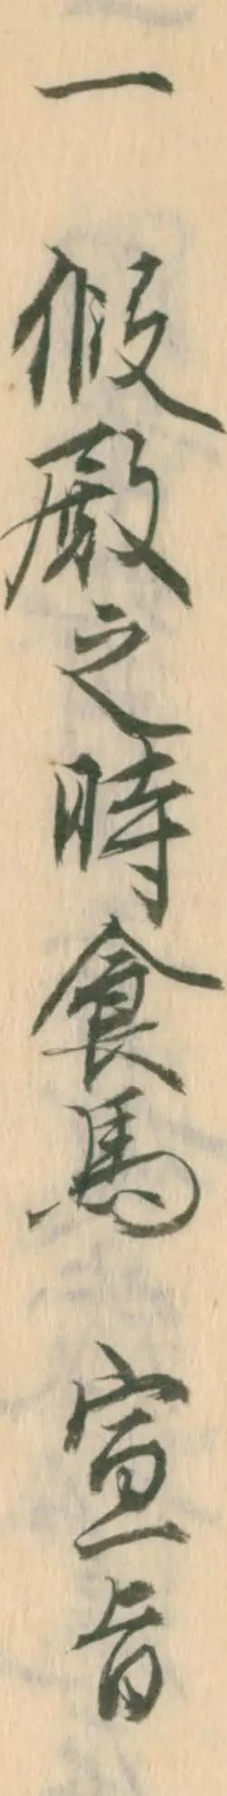一仮殿之時食馬宣旨
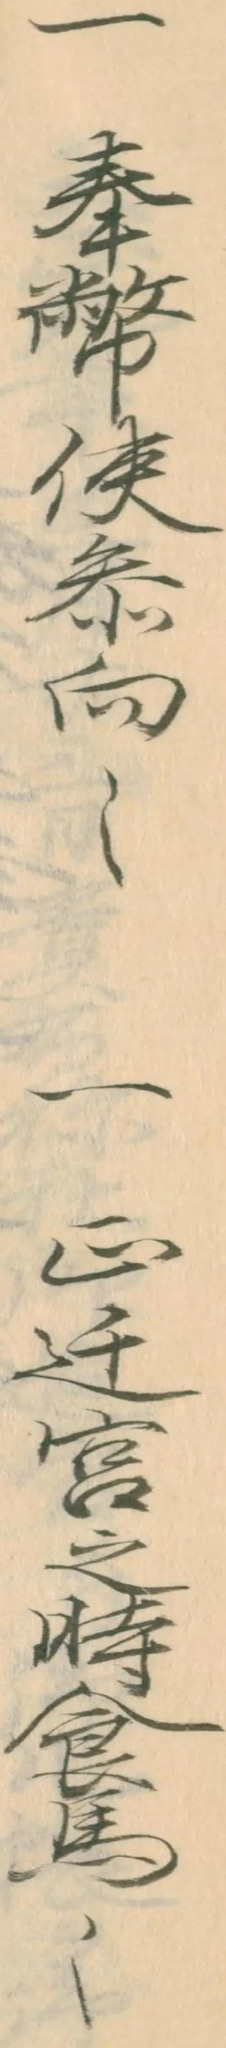一奉幣使参向ーー一正遷宮之時食馬ーー
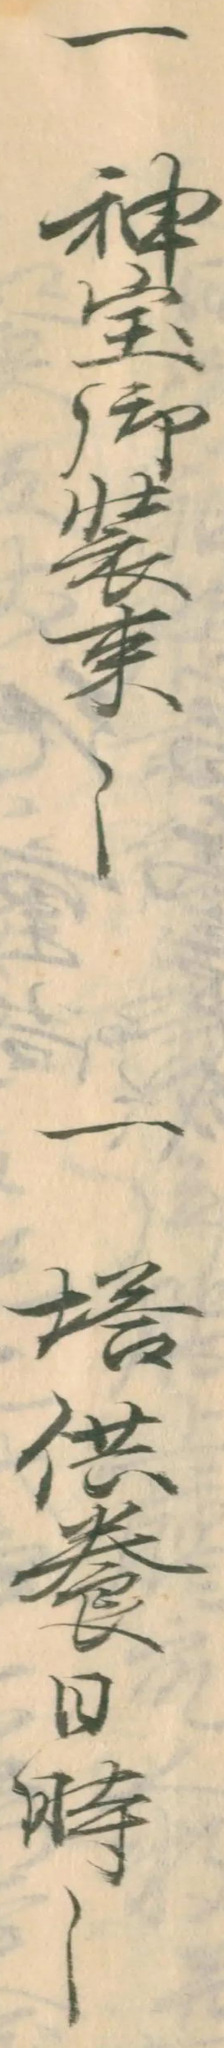一神宝御装束ーー一塔供養日時ーー
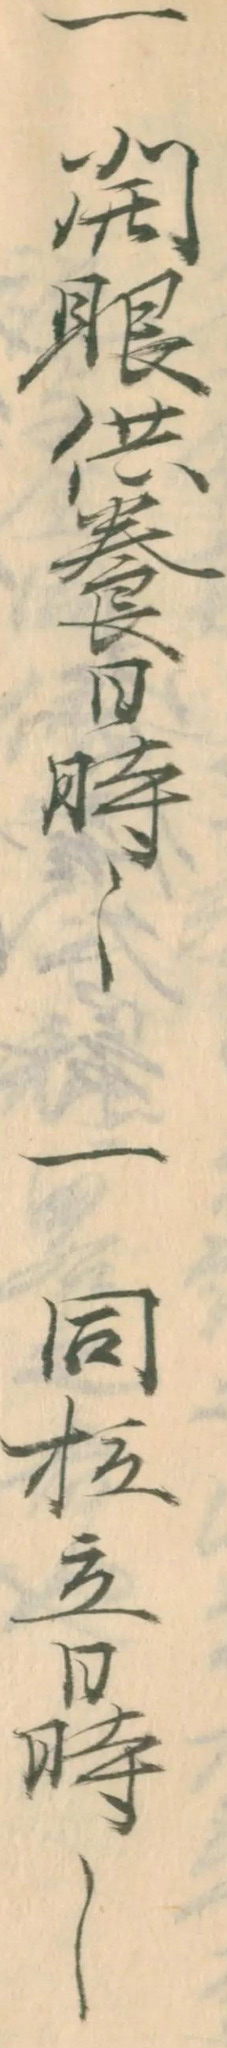一開眼供養日時ーー一同柆立日時ーー
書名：賀茂社記録. 第15冊
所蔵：国立国会図書館 National Diet Library, JAPAN
